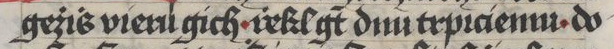geżiš vieru gich.ṙekl ḡt dnu trpicíemu.do¬
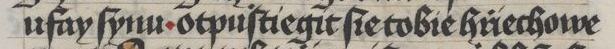ufay ſynu.otpuẛtiegit ſie tobie hṙiechowe
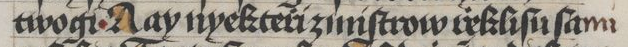twogi.A ay nyekteṙí zmiſtrow ṙekli ſu ſami
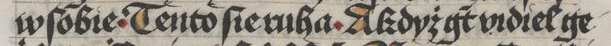w ſobie:Tento ſie ruha.A když ḡt vidiel ge¬
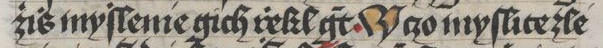żiṡ myẛleníe gich ṙekl ḡt.Y co myſlite zlé
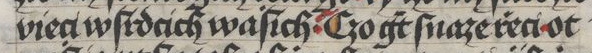vieci wſrdcích waẛich.Co ḡt ſnaze ṙeci ot¬
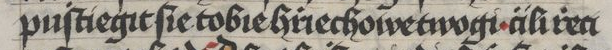puẛtiegit ſie tobie hṙiechowe twogi.ċíli ṙeci
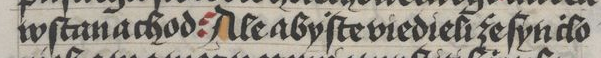wſtan a chod?Ale abyẛte viedieli że ſyn ċlo¬
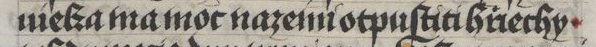uieka ma moc nazemi otpuſtiti hṙiechy.
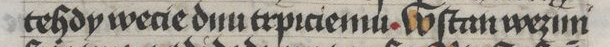tehdy wecie dnu trpiciemu.Wſtan wezmi¬
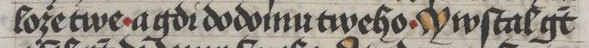loże twe.a gdi dodomu tweho.Y wſtal ḡt
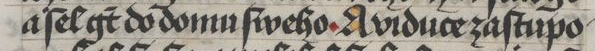a ẛel ḡt do domu ſweho.A viduce zaſtupo¬
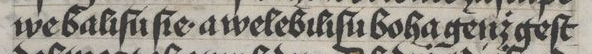we bali ſu ſie.a welebili ſu boha genż geſt
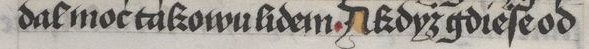dal moc takowu lidem.A kdyż gdieẛe od
